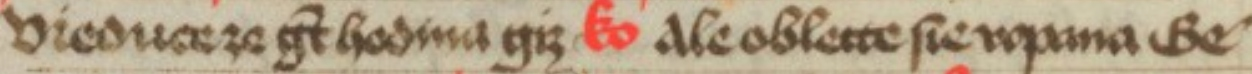Vieduce ze g̑t hodina giz ko Ale oblecce ſie wpama Ge-
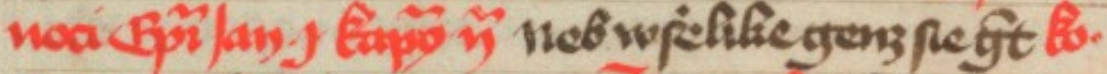noci Ep̃i Jan j kap̃y ïj Neb wẛelike genz ſie g̑t ko.
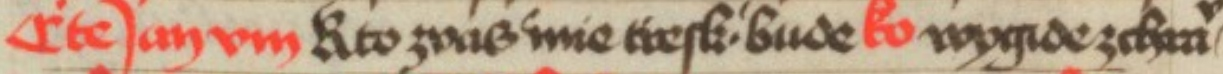Ċte Jan viij Kto zvas mie tṙeſk. bude ko wygide zchrav
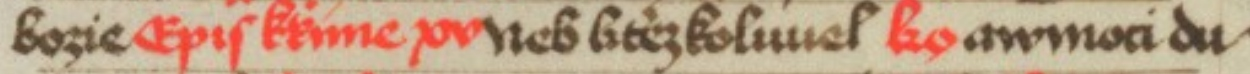bozie Epiſ k ṙime xv Neb ktėzkoliuiel ko awmoci du-
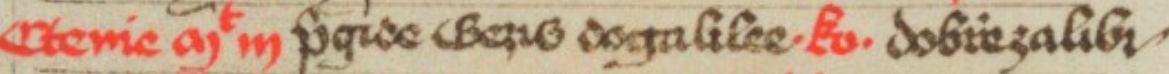Ctenie ajt in p̑gide Gezis dagalilee.ko. dobṙezalibi-
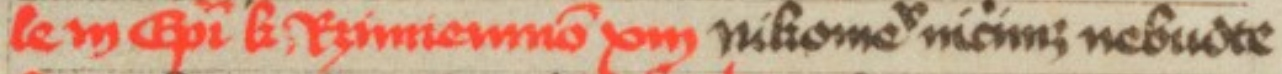le iii Ep̃i k rzimiemnȏ xiij Nikomev niċimz nebudte
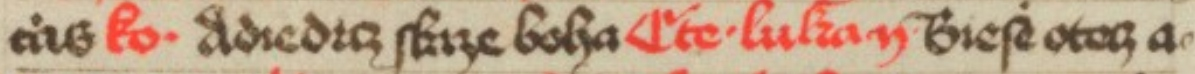ċas ko. Adiedicz ſkrze boha Cte.luka ij Bieẛe otecz a
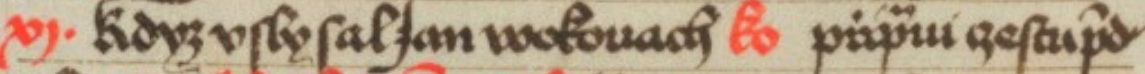xj· Kdyz vſlyſal Jan wokouach ko pṙip̃ui czeſtu p̑d-
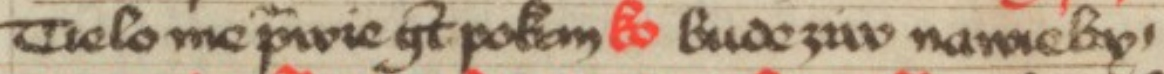Tielo me p̃wie g̑t pokrm ko bude ziw nawieky
